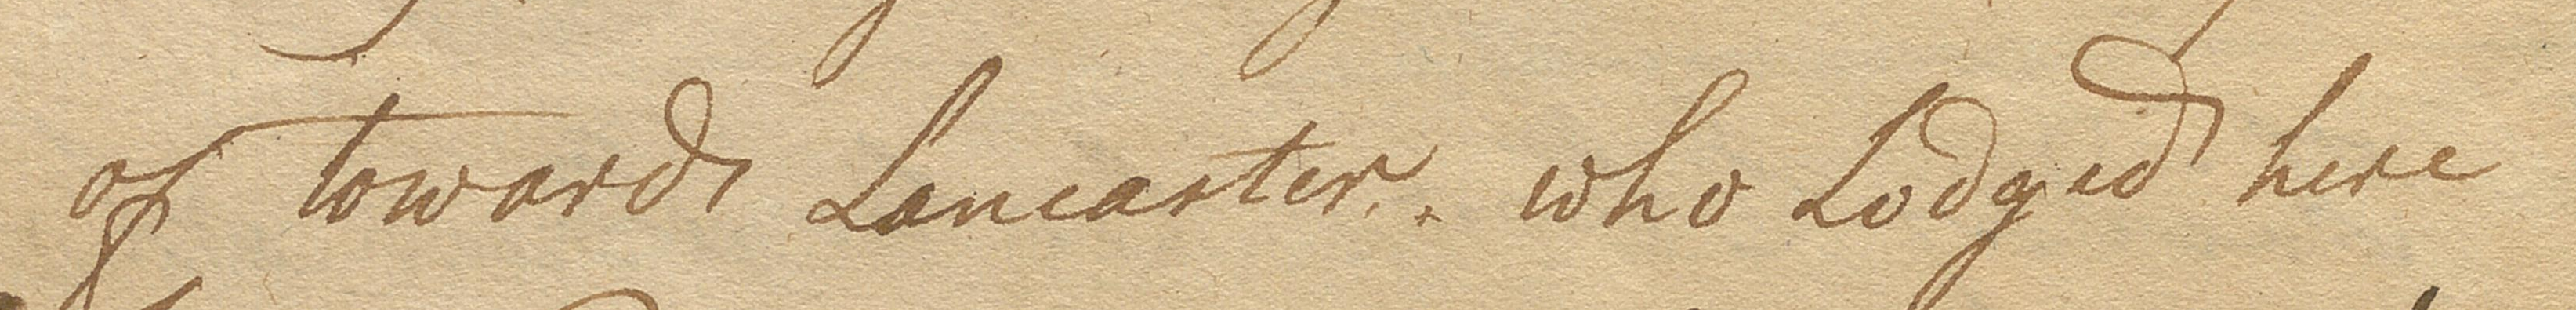of towards Lancaster who Lodged here
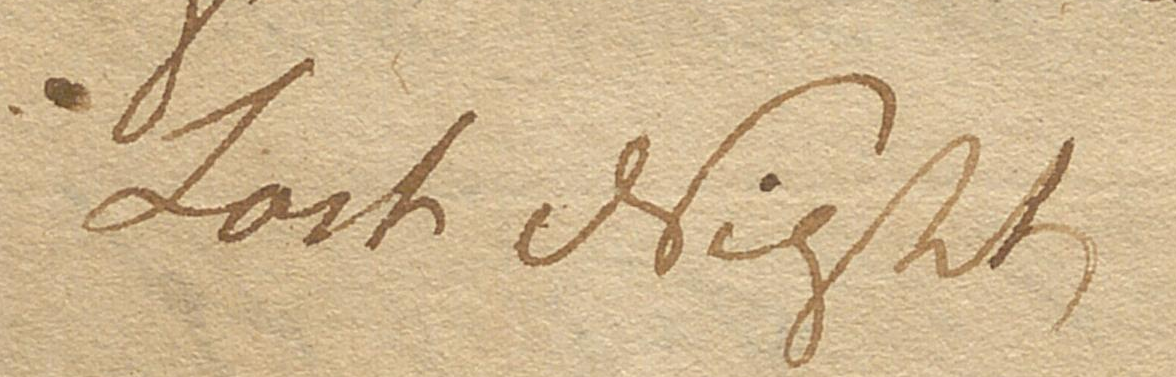Last Night
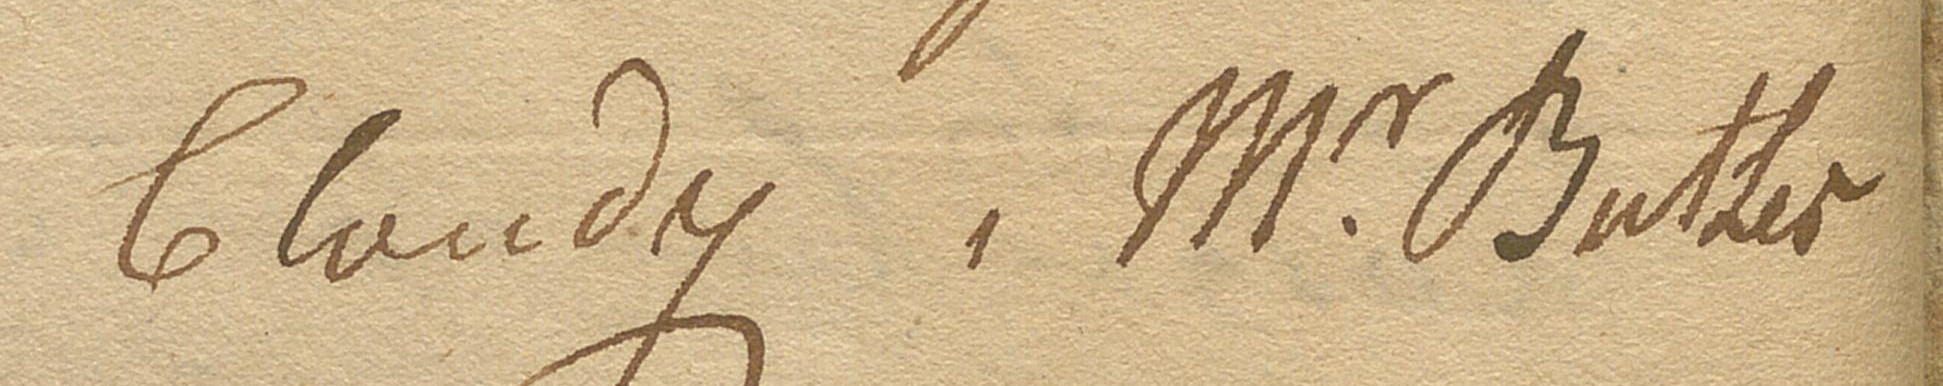Cloudy, M^r. Butler
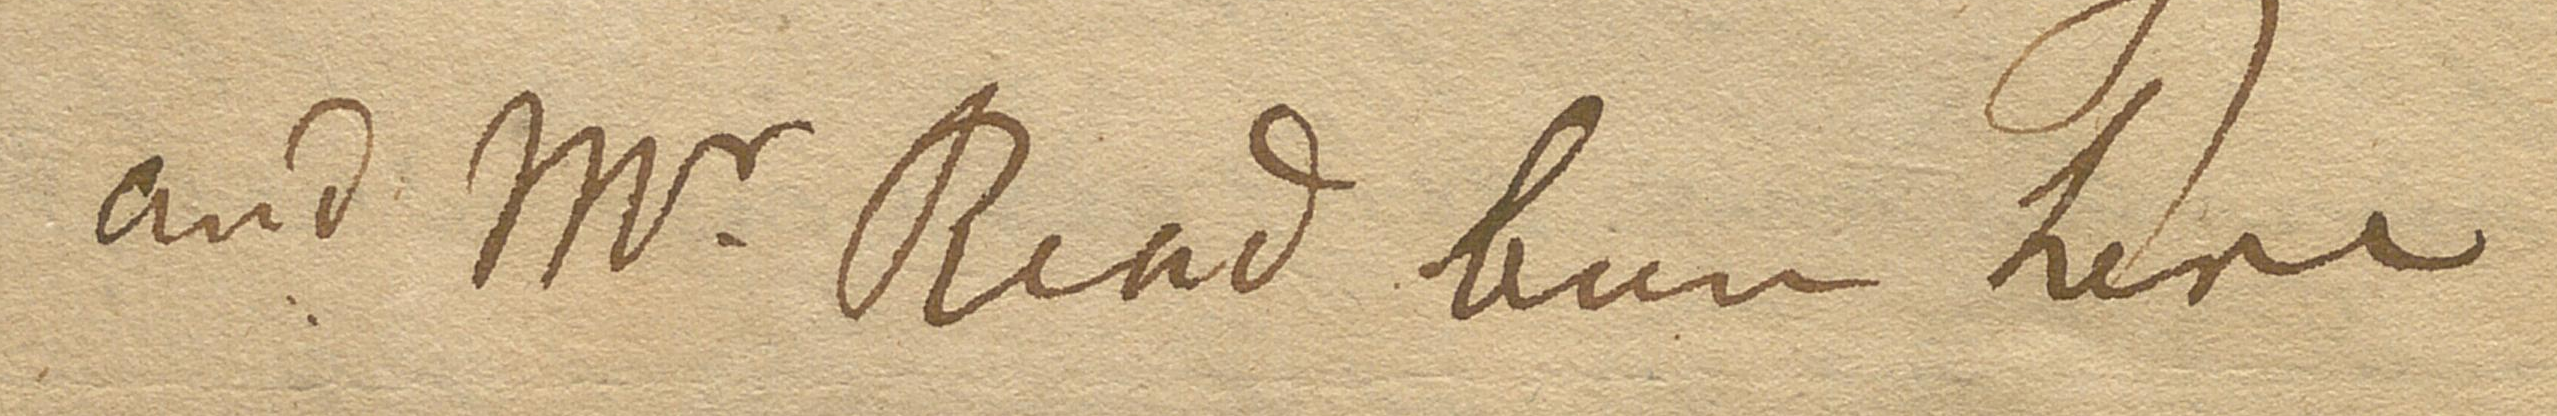and M^r. Read been here
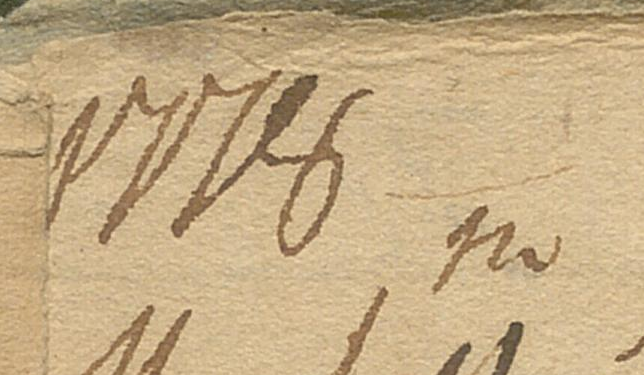1778
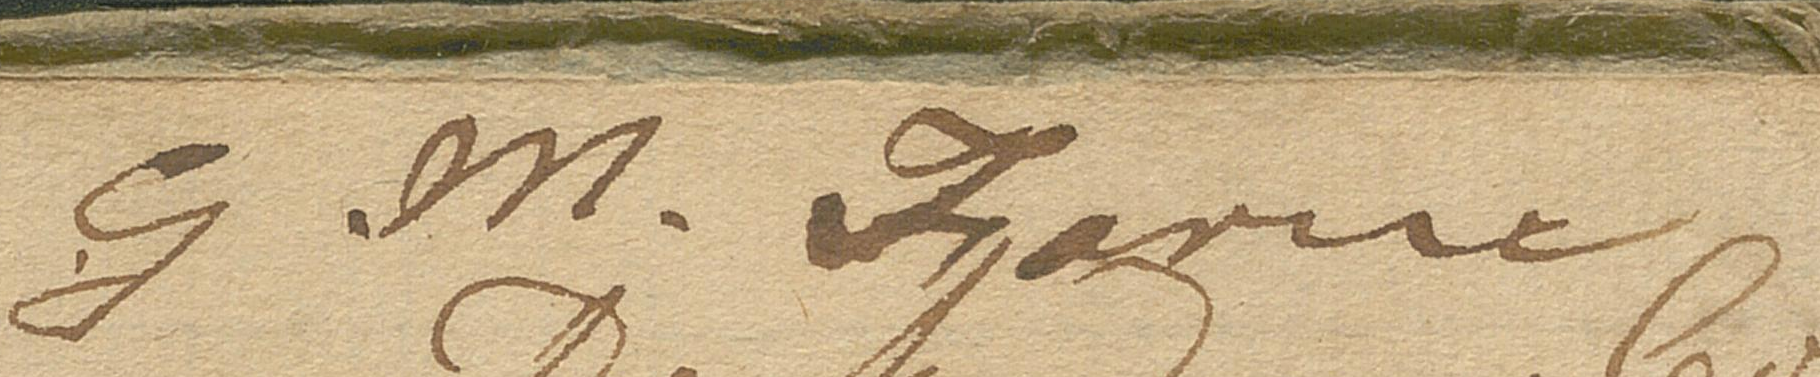G. M. Farm
